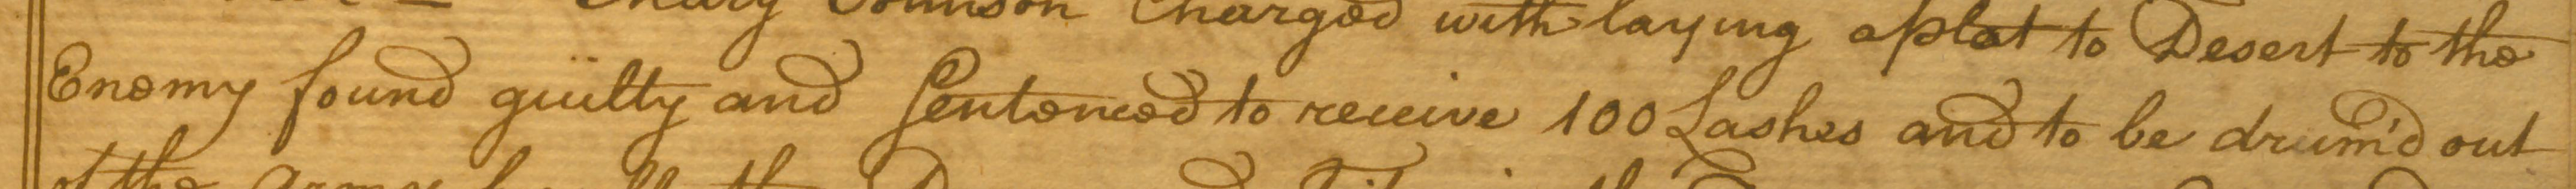Enemy found guilty and sentenced to receive 100 Lashes and to be drum'd out
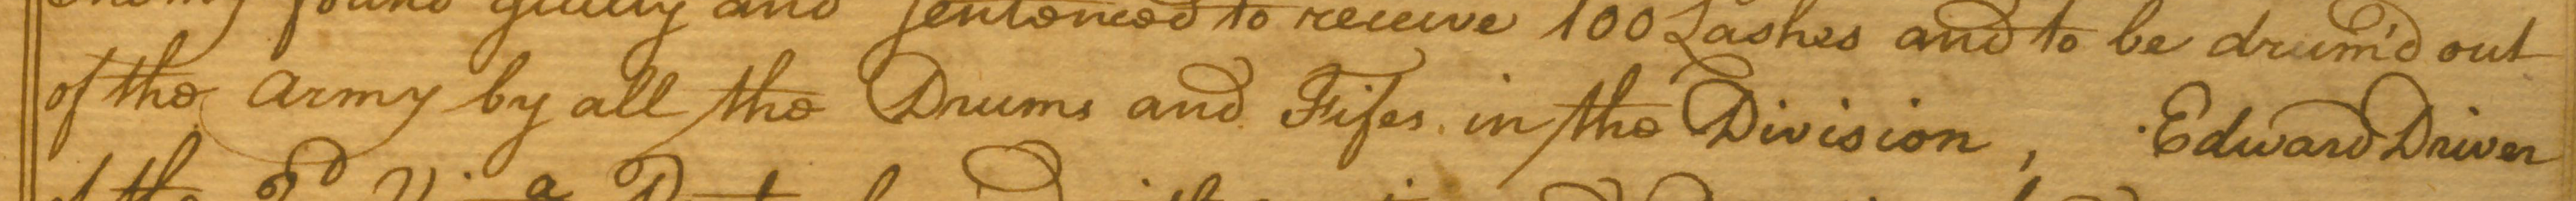of the Army by all the Drums and Fifes in the Division, Edward Driver
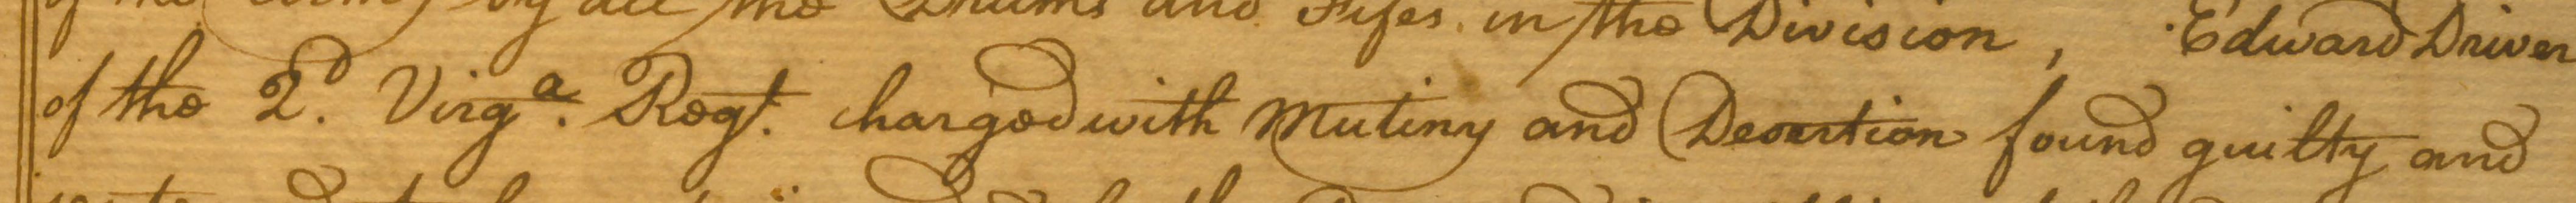of the 2^d. Virg^a. Reg^t. charged with mutiny and Desertion found guilty and
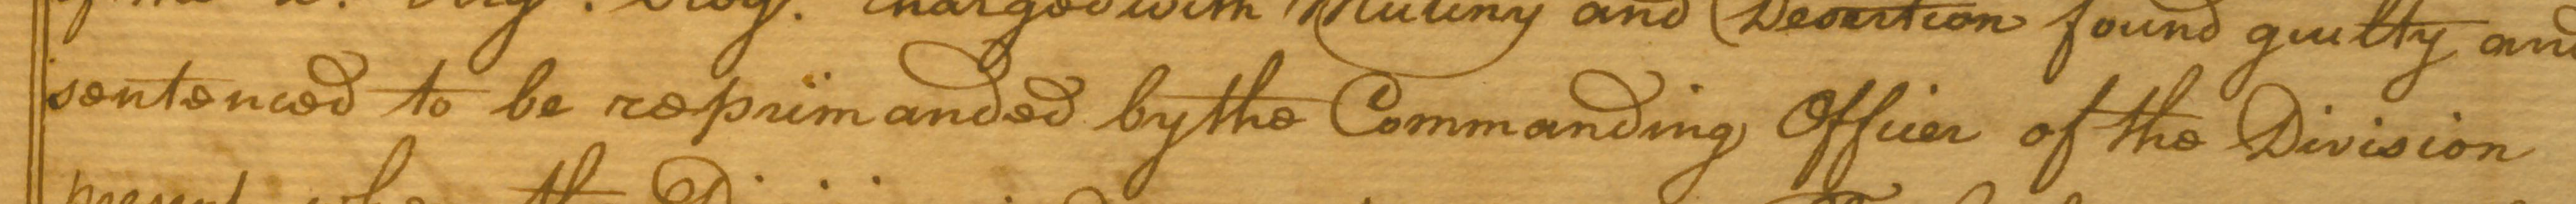sentenced to be reprimanded by the Commanding Officer of the Division
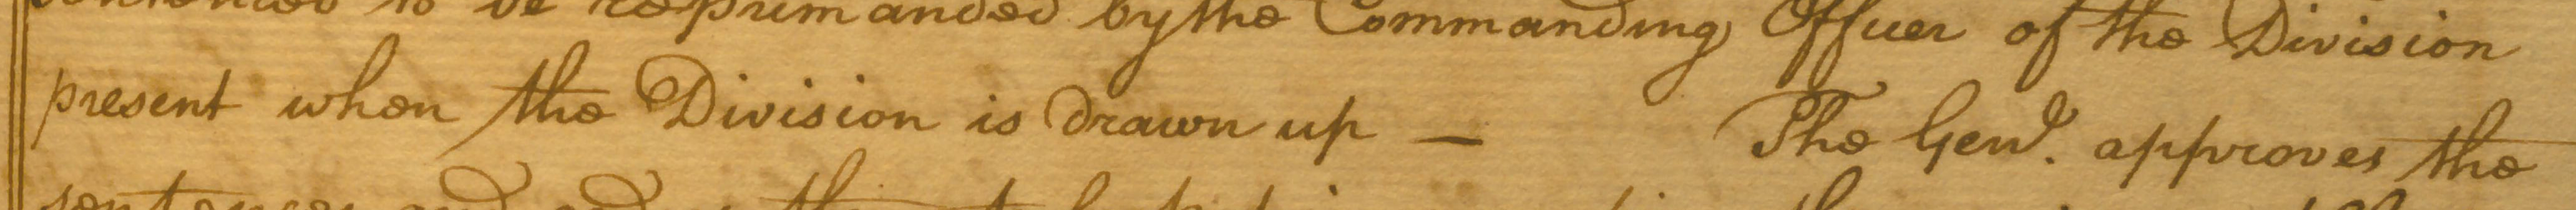present when the Division is drawn up- The Gen^l. approves the
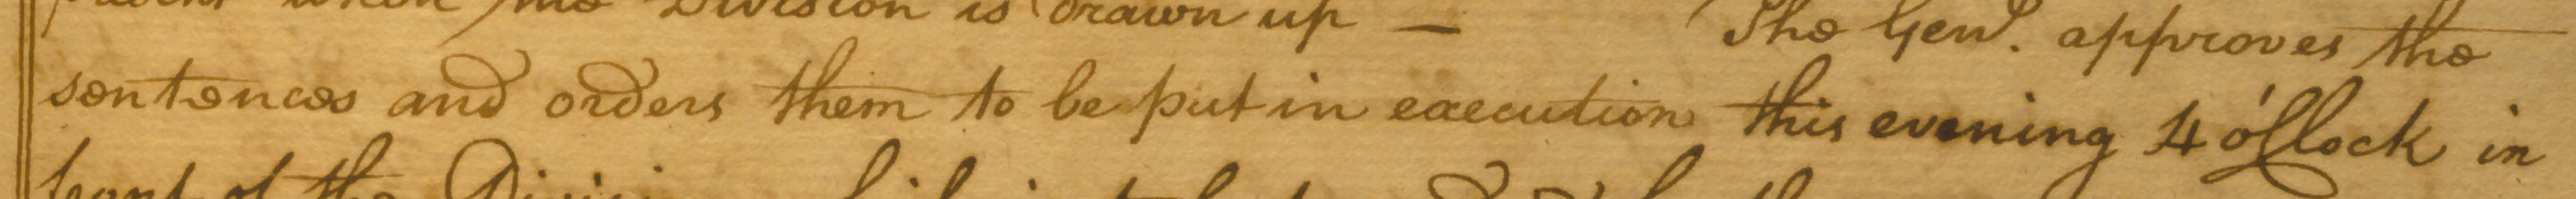sentences and orders them to be put in execution this evening 4 o'Clock in
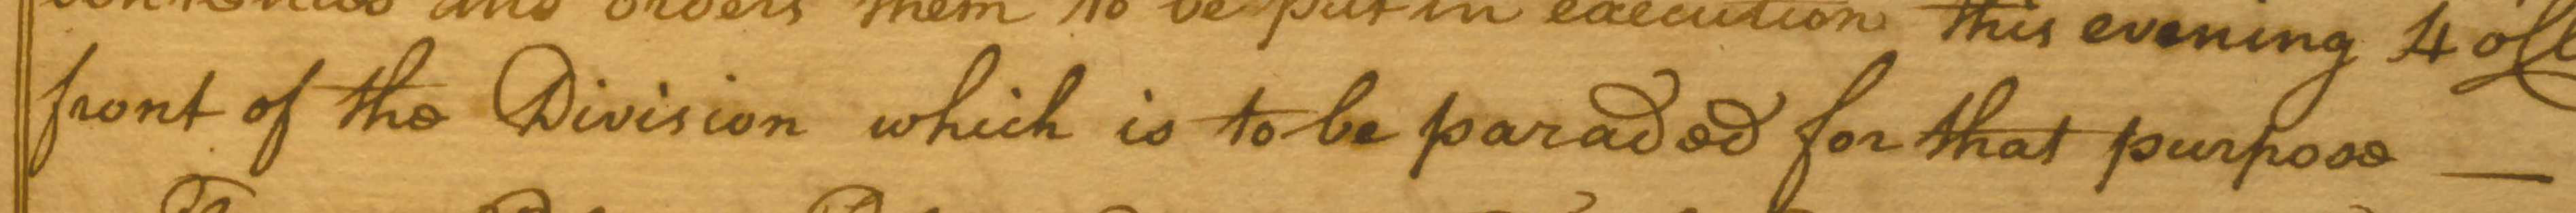front of the Division which is to be paraded for that purpose-
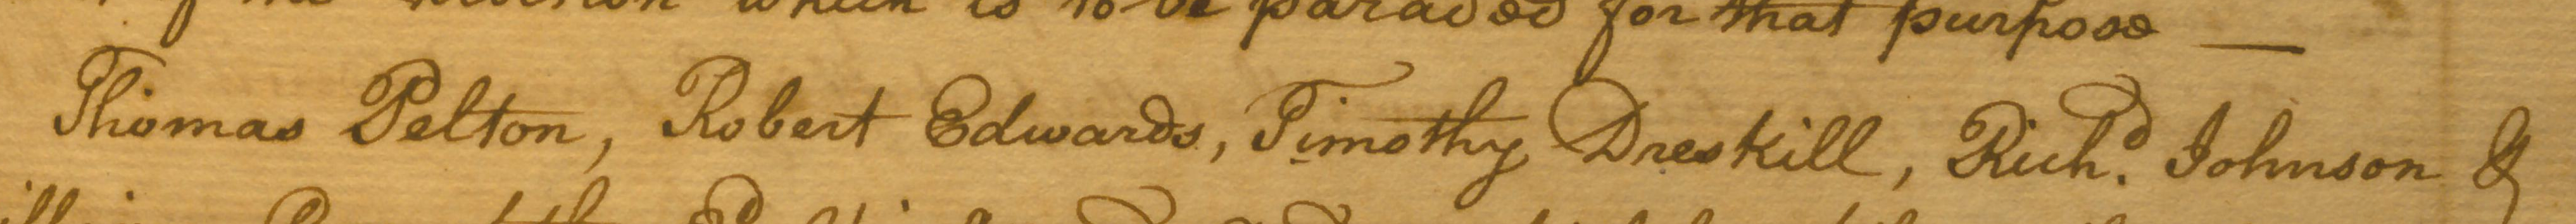Thomas Pelton, Robert Edwards, Timothy Dreskill, Rich^d. Johnson &
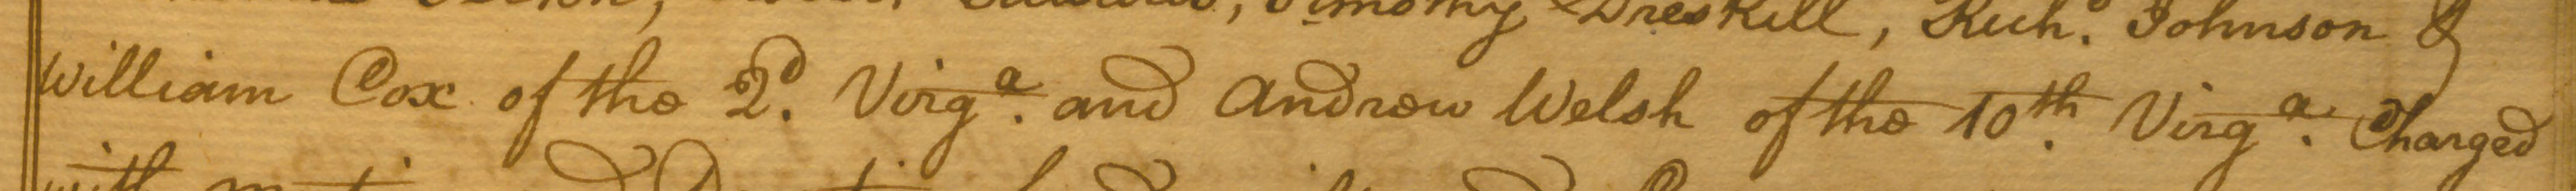William Cox of the 2^d. Virg^a. and Andrew Welsh of the 10^th. Virg^a. Charged
